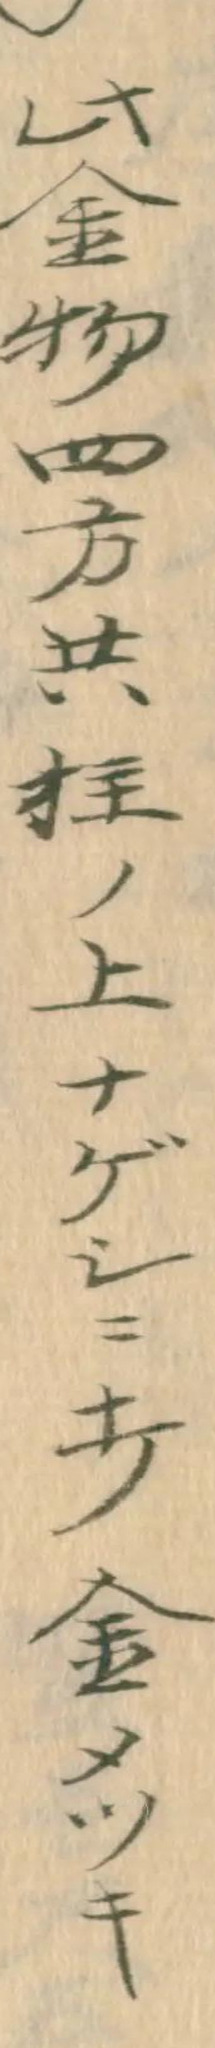此金物四方共柱ノ上ナゲシニ打金メツキ
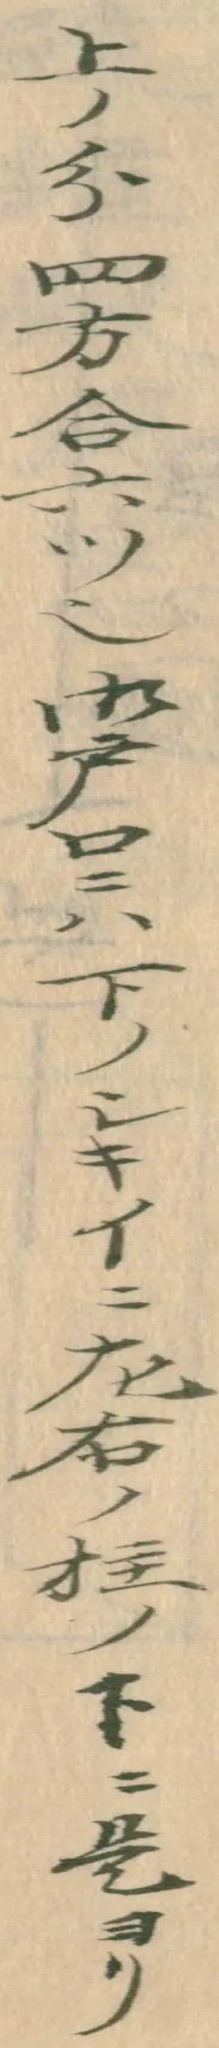上ノ分四方合六ツ也御戸口ニハ下ノシキイニ左右ノ柱ノ下ニ是ヨリ
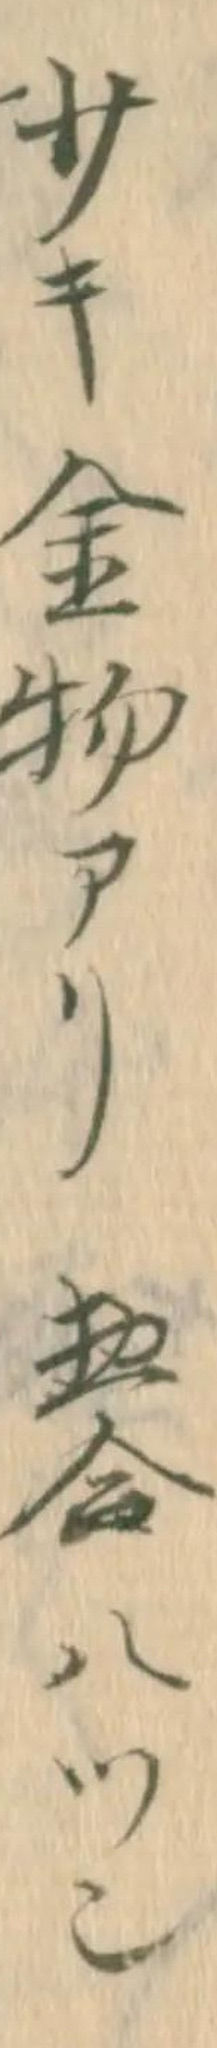少キ金物アリ惣合八ツ也
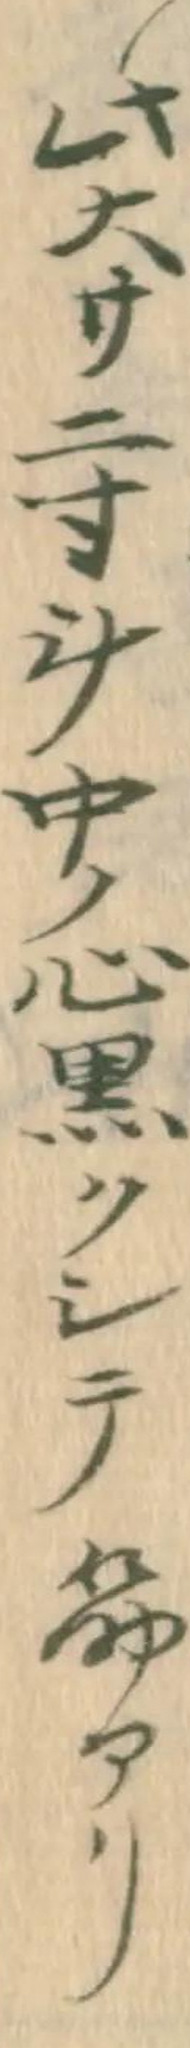(此大サ二寸計中ノ心黒クシテ筋アリ
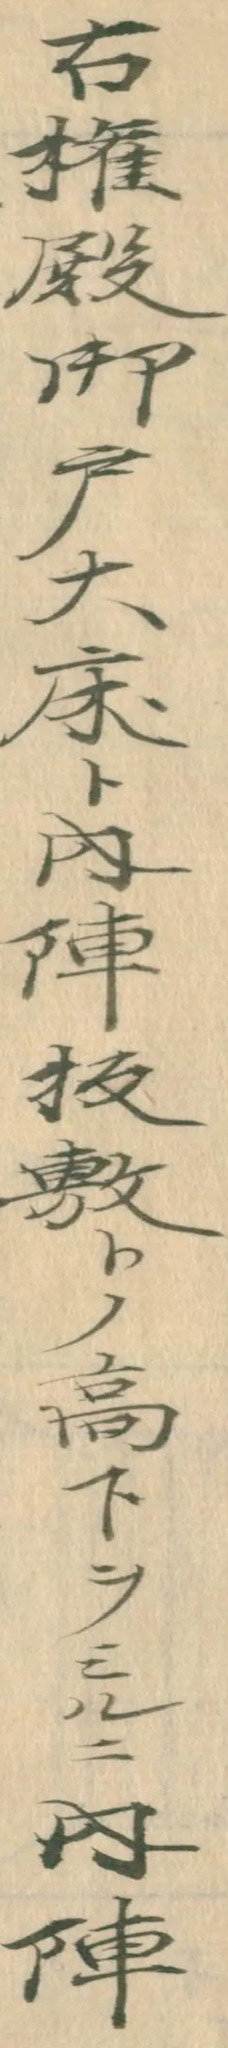古権殿御戸大床ト内陣板敷トノ高下ヲミルニ内陣
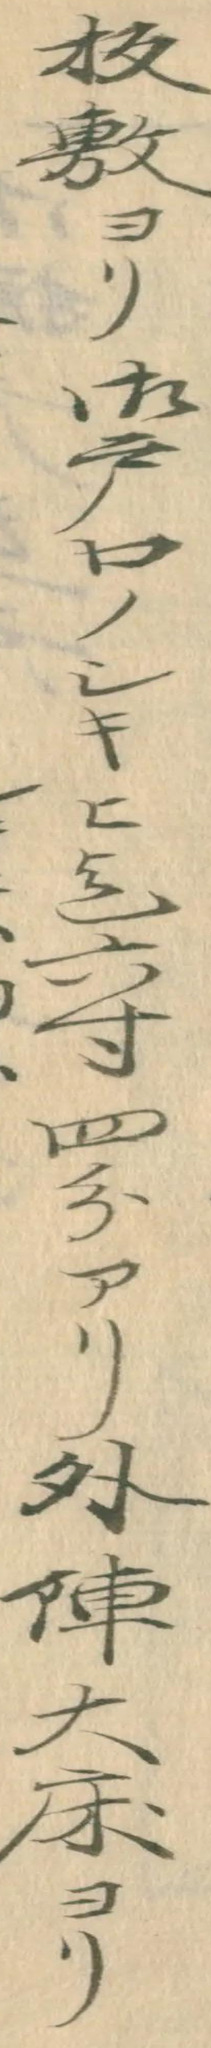板敷ヨリ御戸口ノシキヒ迄六寸四分アリ外陣大床ヨリ
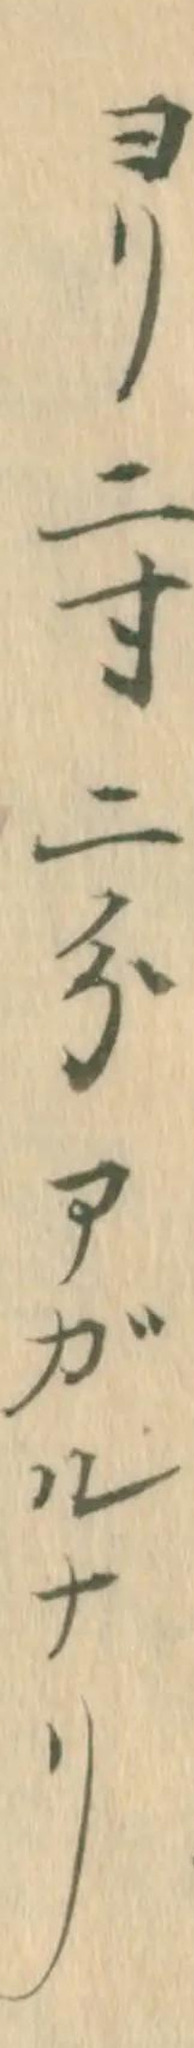ヨリ二寸二分アガルナリ

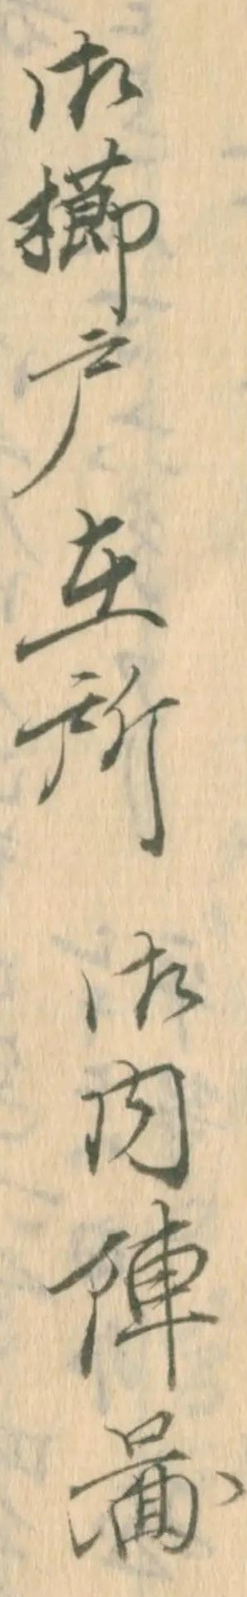御櫛戸在所御内陣図
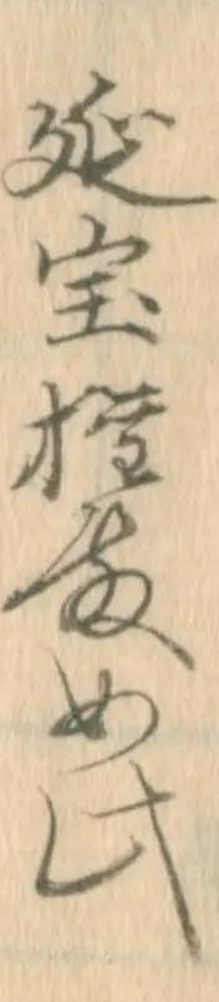延宝権殿如此
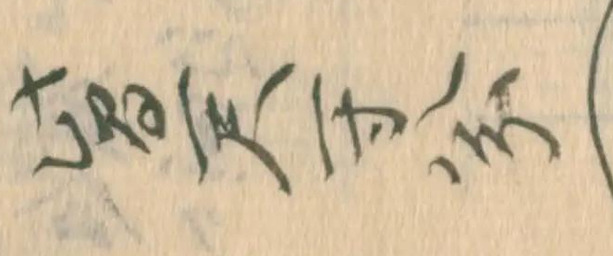此間一尺一寸八分
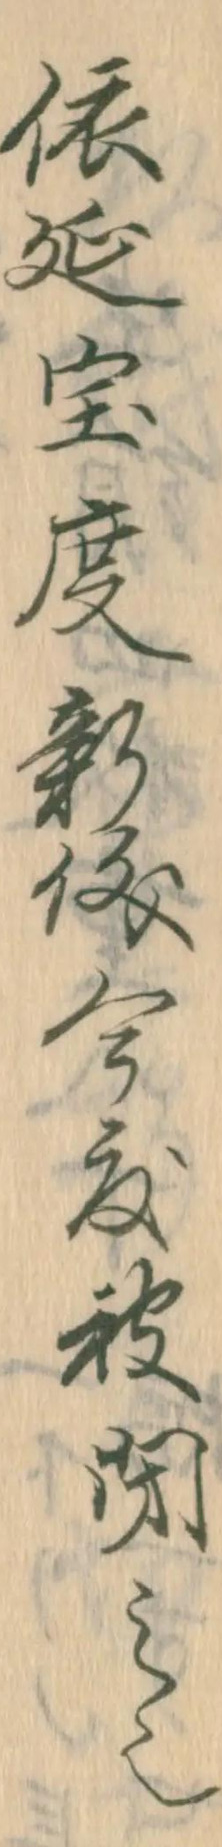依延宝度新儀今度被閉之也
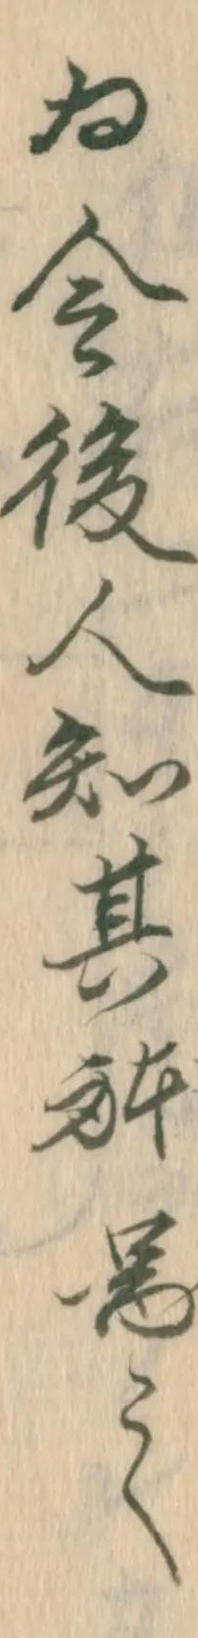為今後人知其体図之
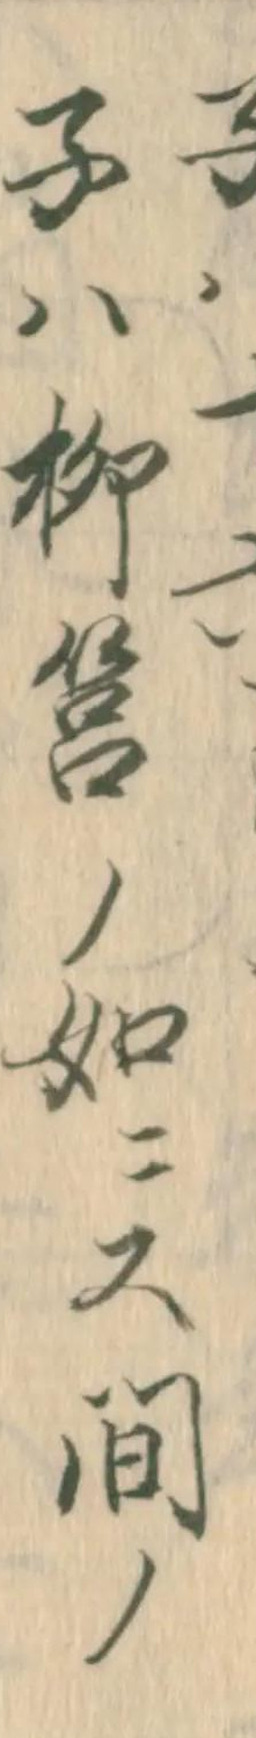子ハ柳筥ノ如ニス間ノ
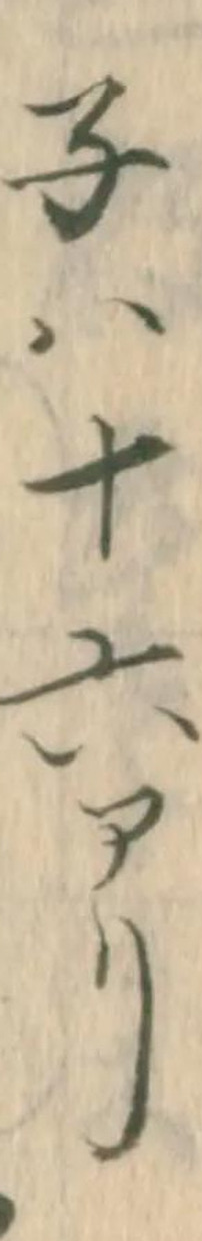子ハ十六アリ
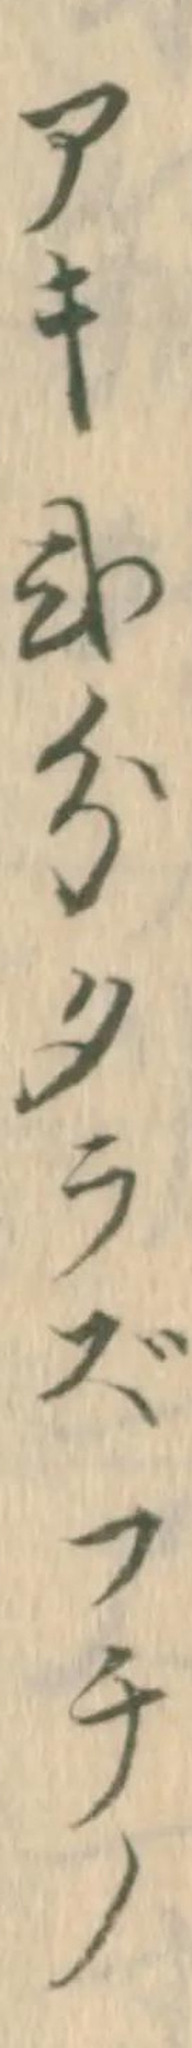アキ弐分タラズフチノ
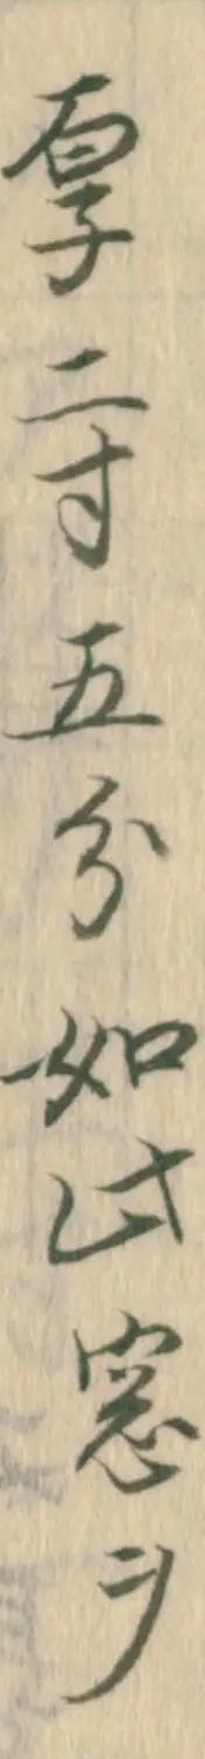厚二寸五分如此窓ヲ
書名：賀茂社記録. 第15冊
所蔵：国立国会図書館 National Diet Library, JAPAN
